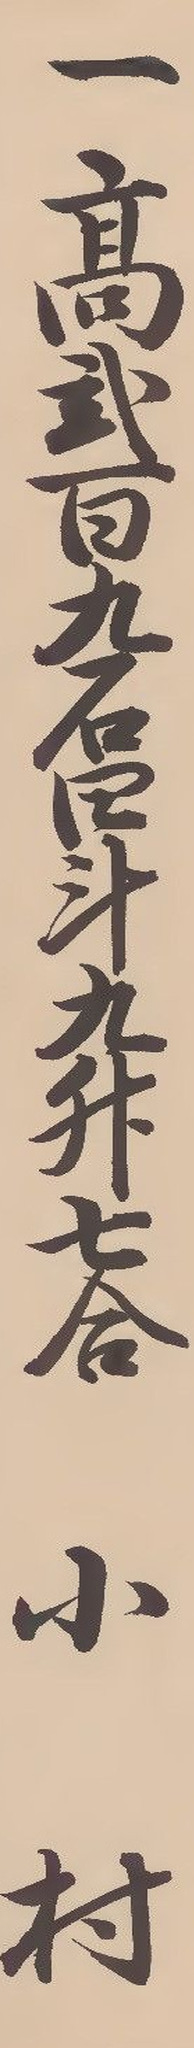一高弐百九石四斗九升七合小村
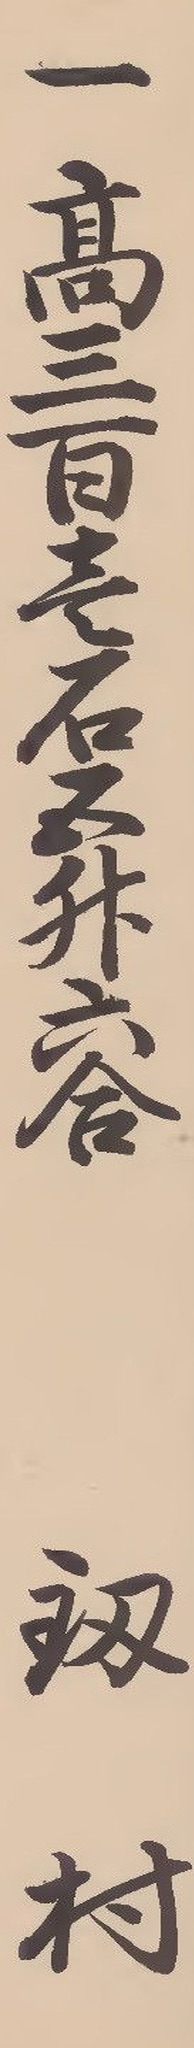一高三百壱石五升六合剣村
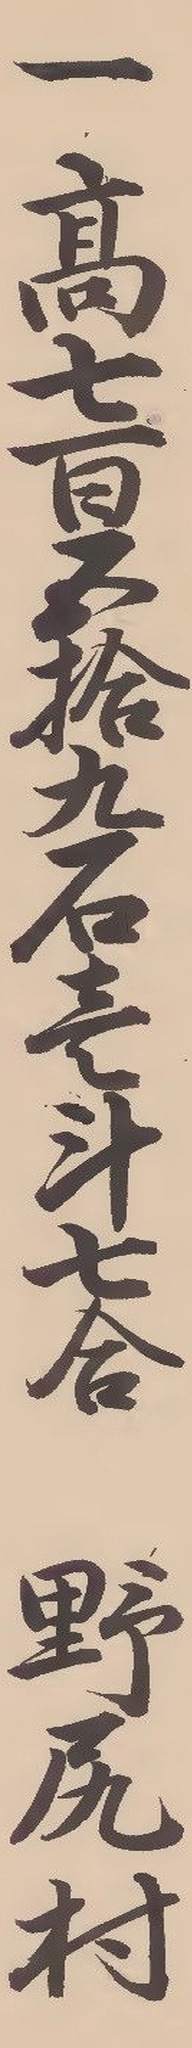一高七百五拾九石壱斗七合野尻村
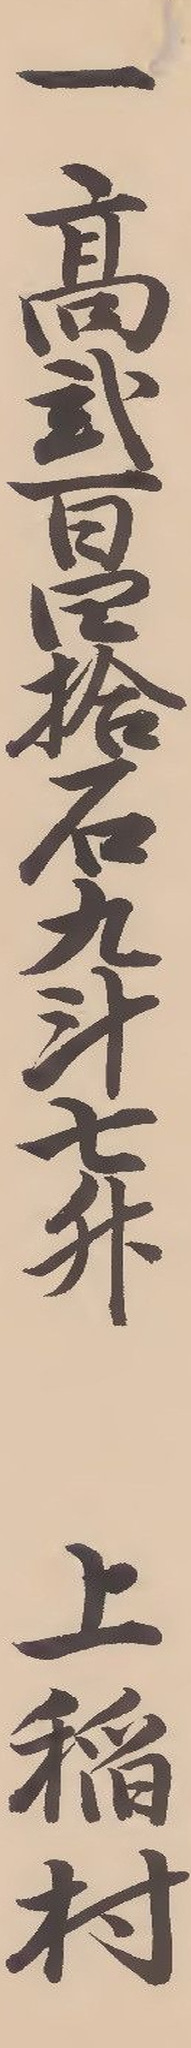一高弐百四拾石九斗七升上稲村
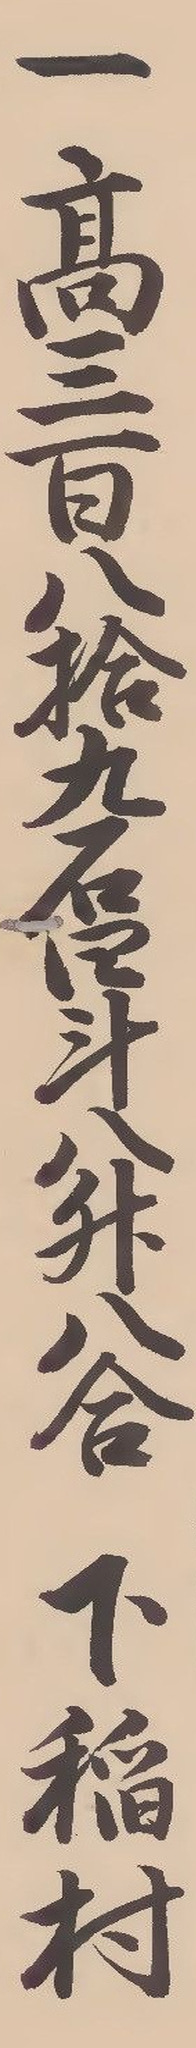一高三百八拾九石四斗八升八合下稲村

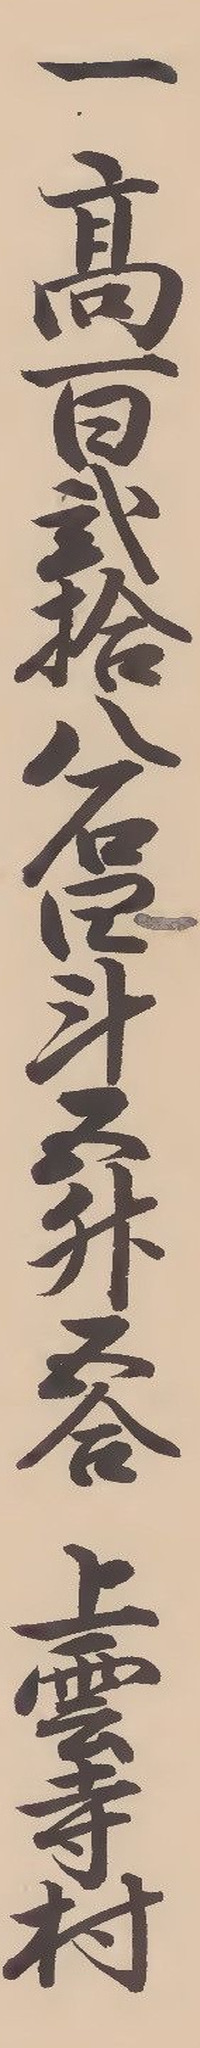一高百弐拾八石四斗五升五合上雲寺村
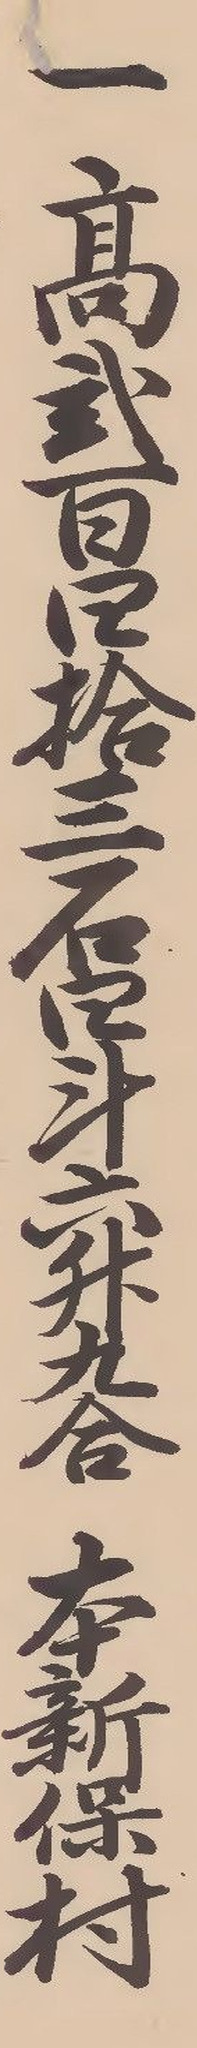一高弐百四拾三石四斗六升九合本新保村
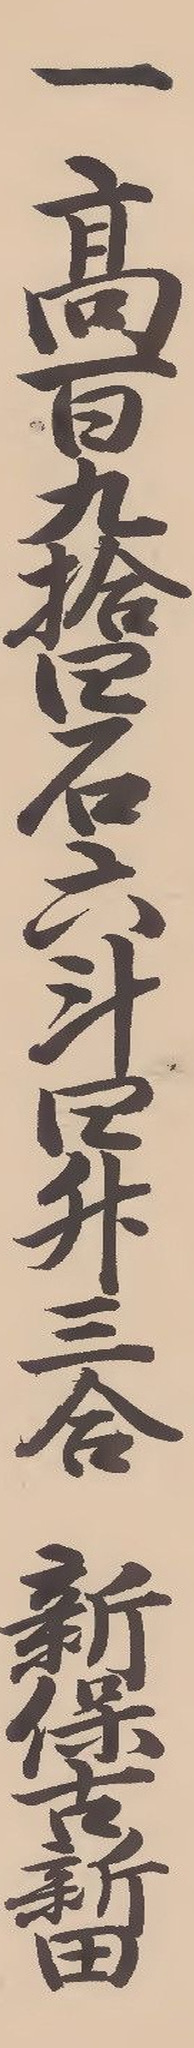一高百九拾四石六斗四升三合新保古新田
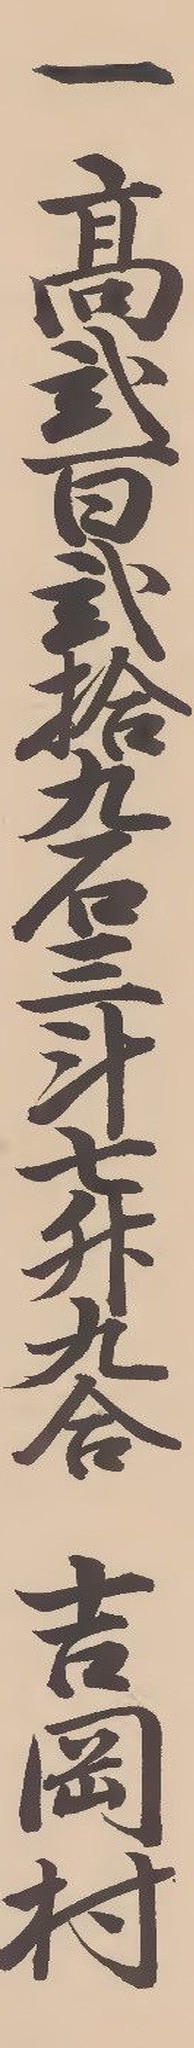一高弐百弐拾九石三斗七升九合吉岡村
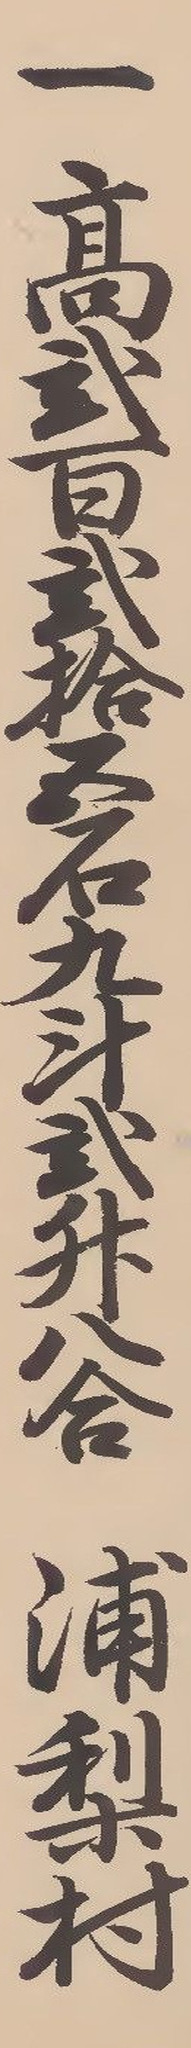一高弐百弐拾五石九斗弐升八合浦梨村
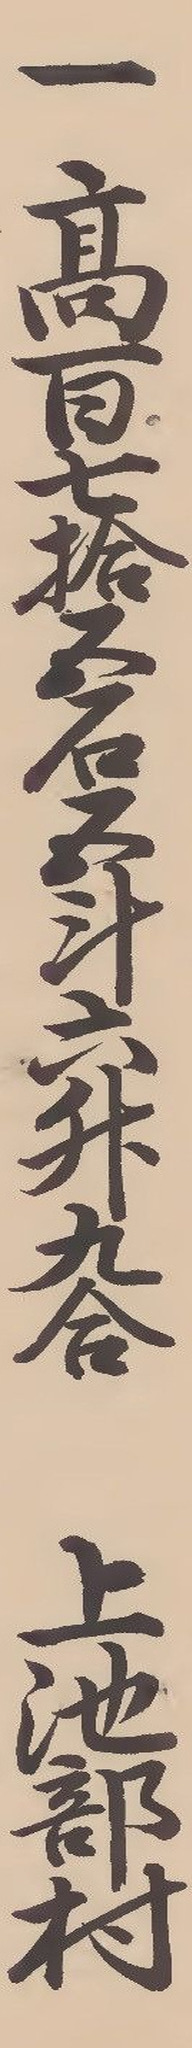一高百七拾五石五斗六升九合上池部村
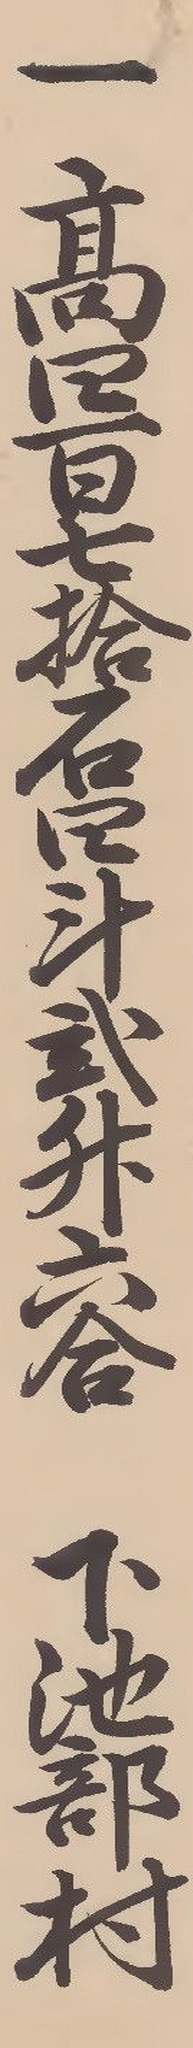一高四百七拾石四斗弐升六合下池部村
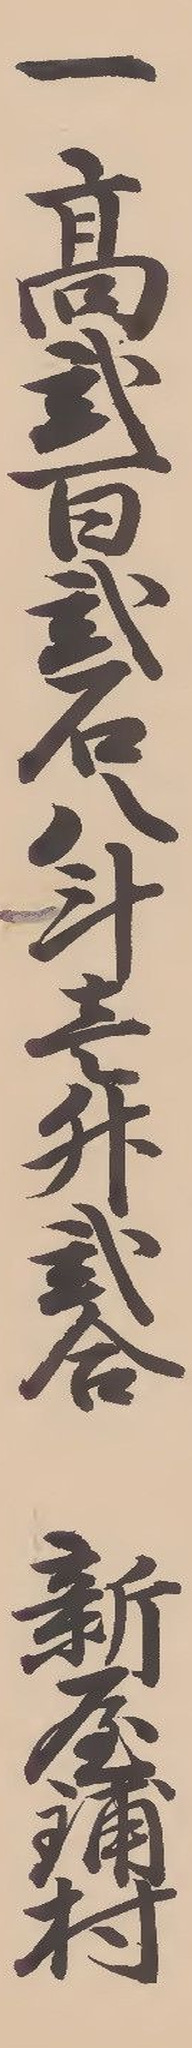一高弐百弐石八斗壱升弐合新家鋪村

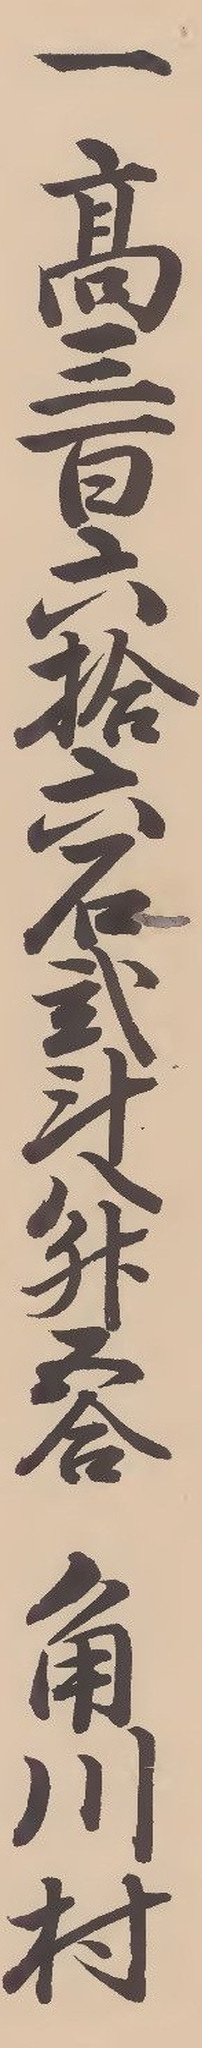一高三百六拾六石弐斗八升五合角川村
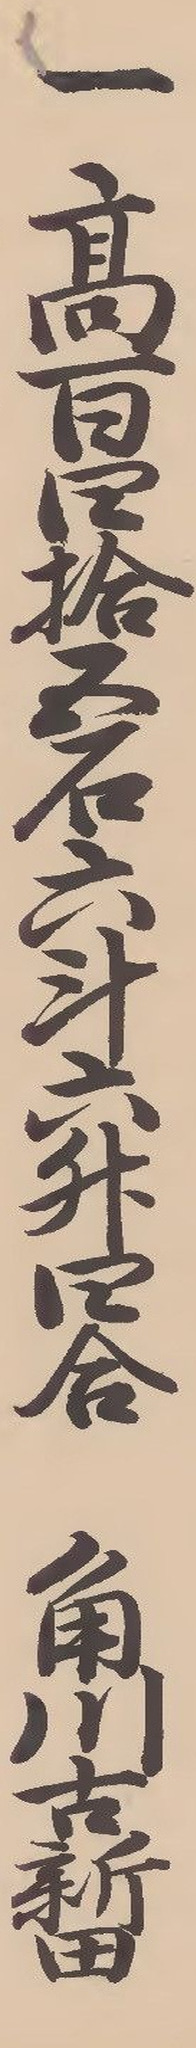一高百四拾五石六斗六升四合角川古新田
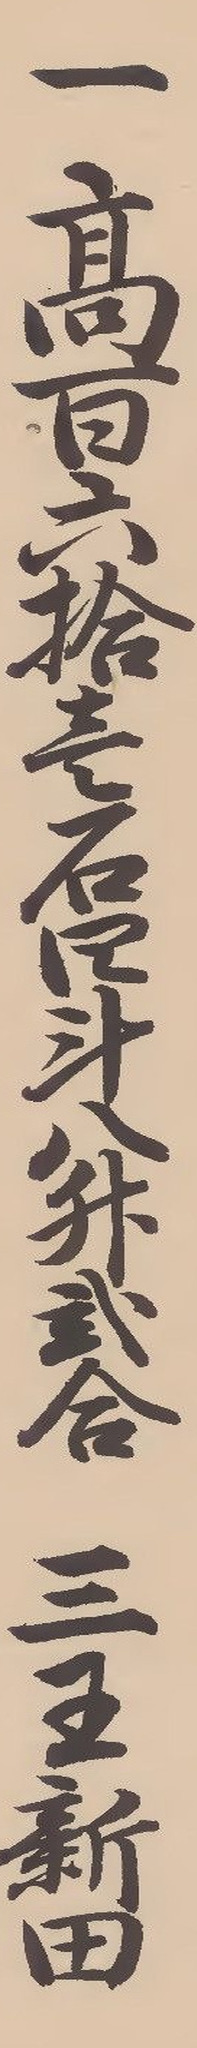一高百六拾壱石四斗八升弐合三王新田
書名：越後国郷帳　上
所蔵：国立公文書館 National Archives of Japan
